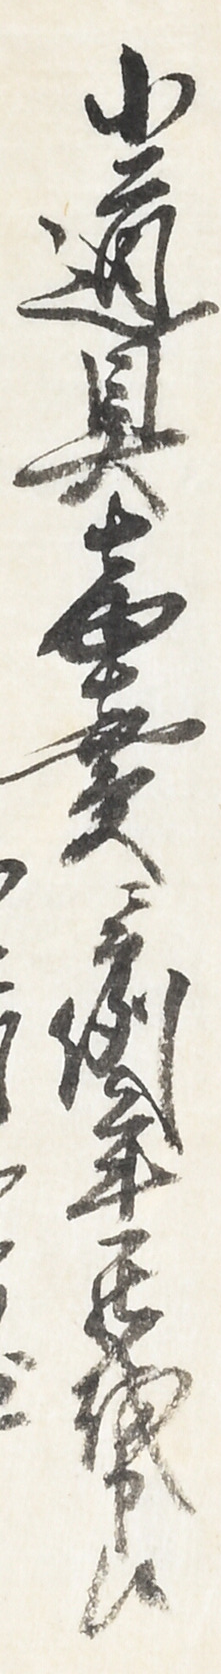小道具商売ニ而例年罷越申候
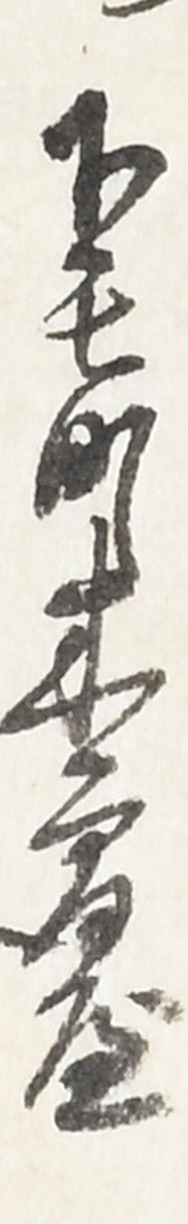下モ町木曽屋
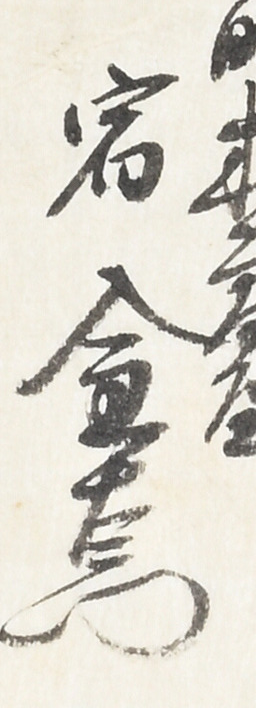宿金右衛門
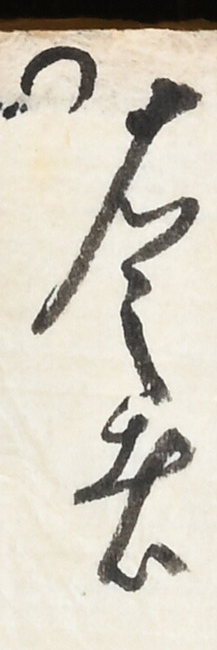右之者

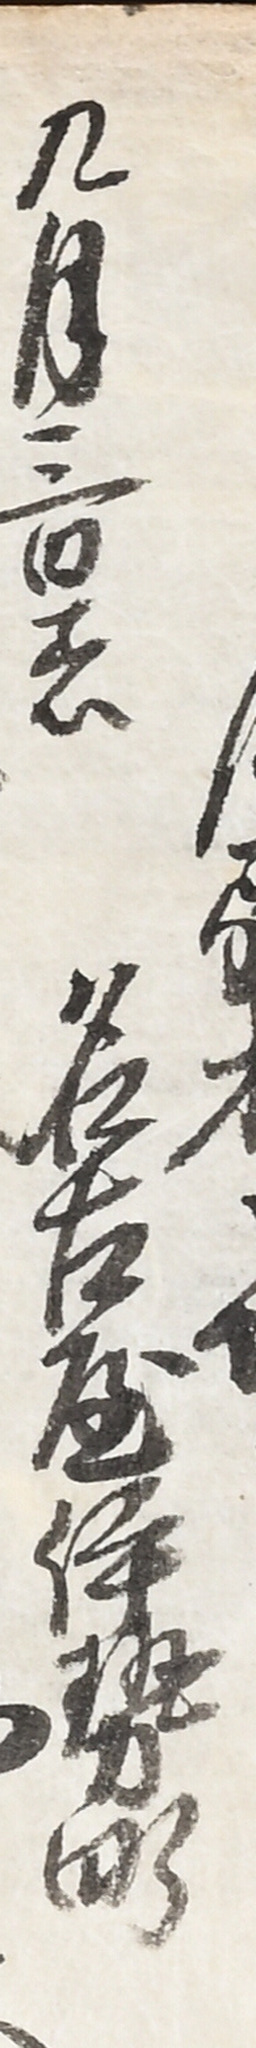九月三日着名古屋伊勢町
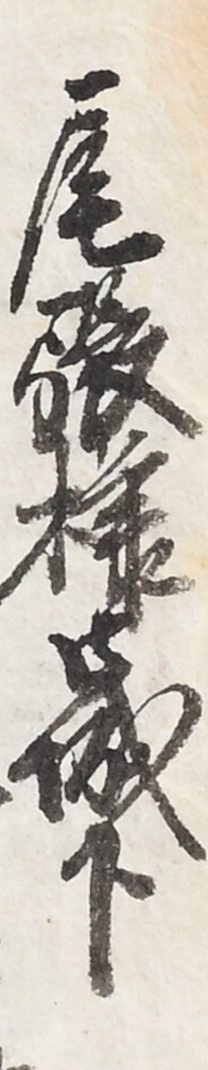尾張様御城下
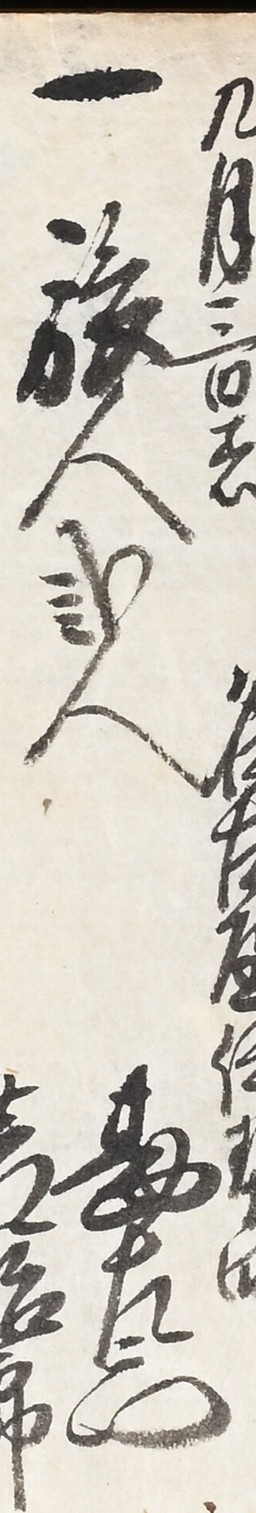一旅人弐人勘左衛門
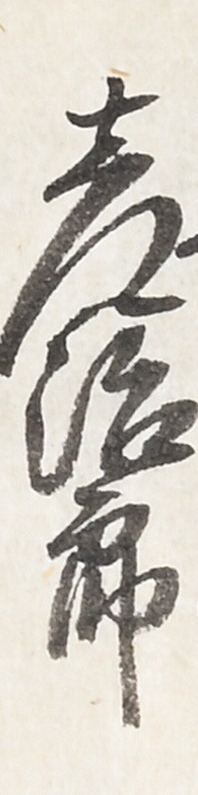彦治郎
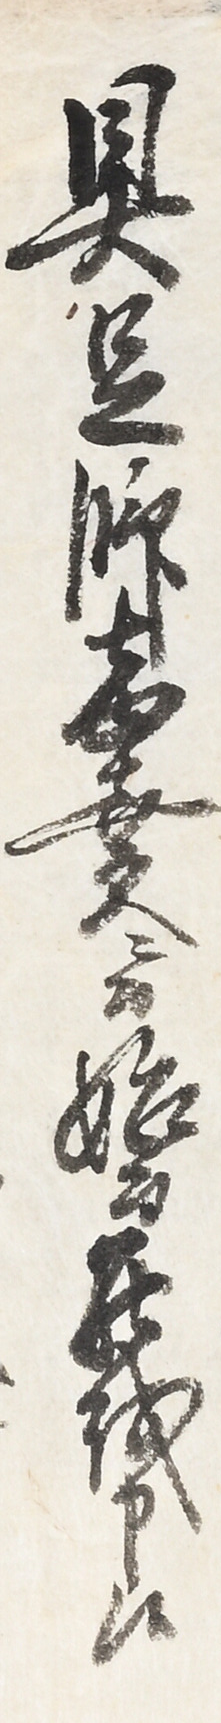具足師商売ニ而始而罷越申候
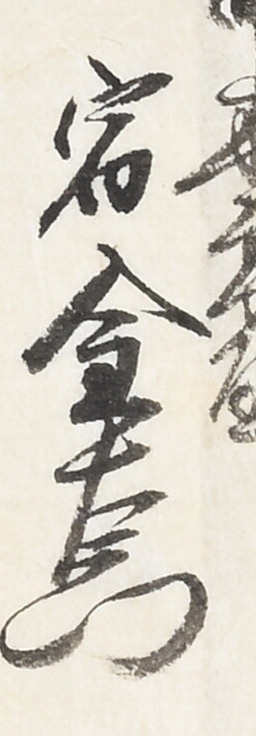宿金右衛門
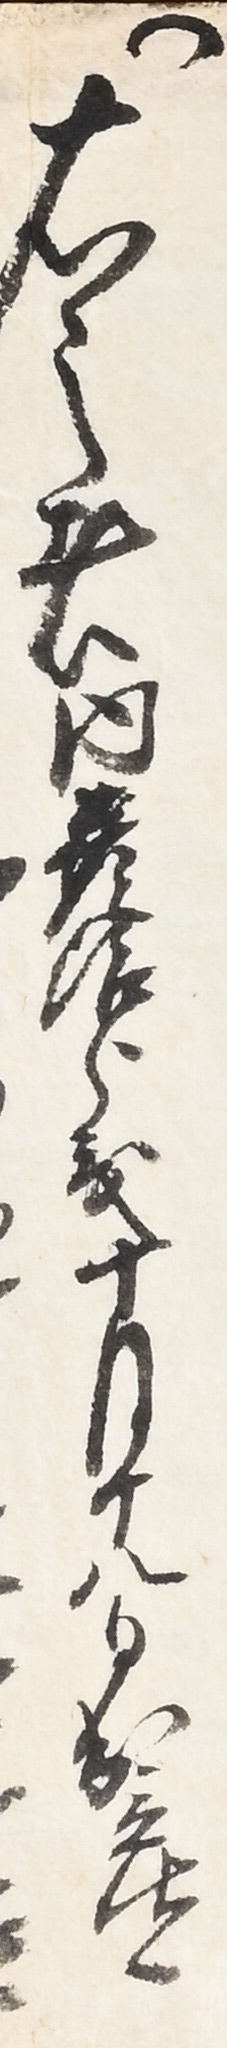右之者内彦治郎義十月十八日出立仕候
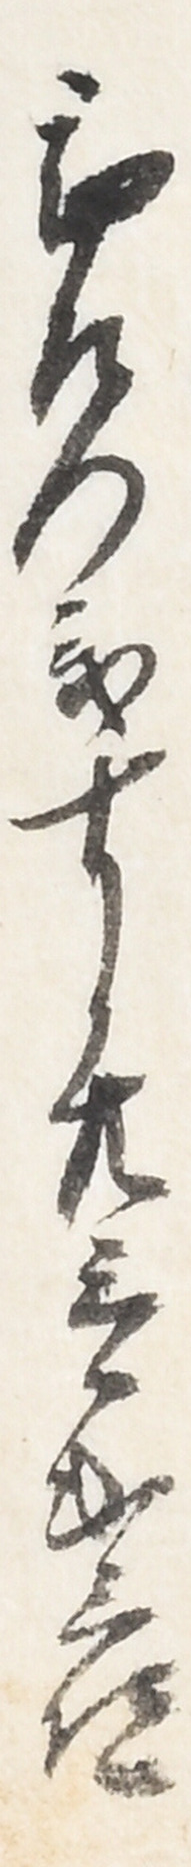勘左衛門義十月廿三日出立仕候
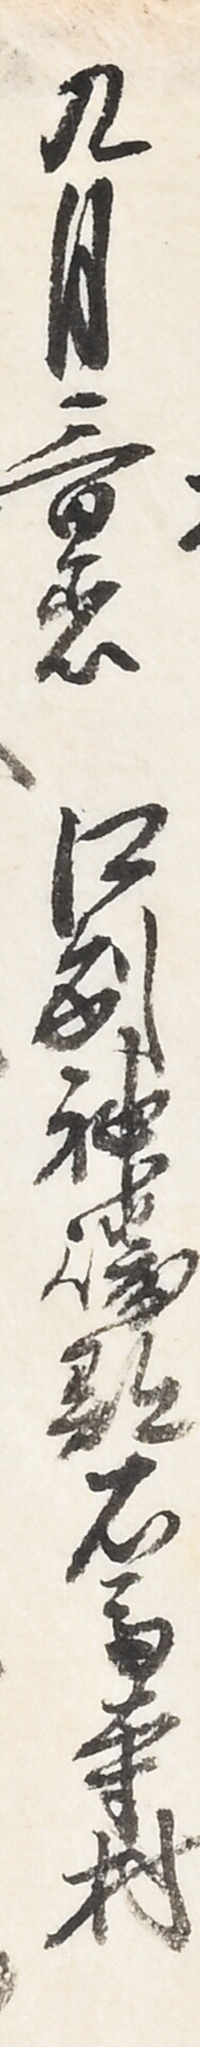九月三日着江州神崎郡石馬寺村
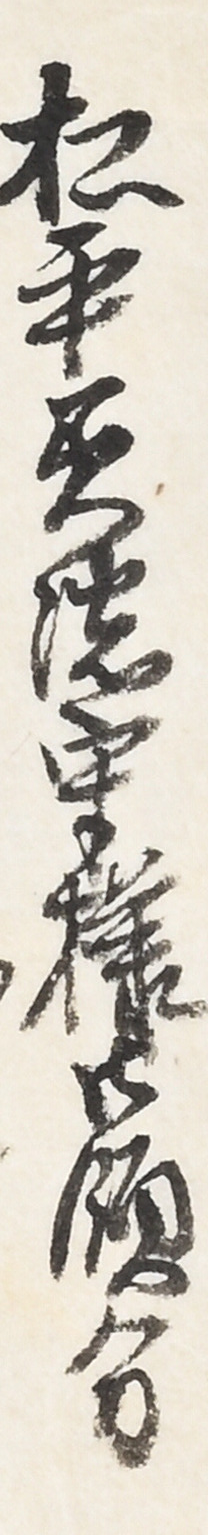松平美濃守様御領分
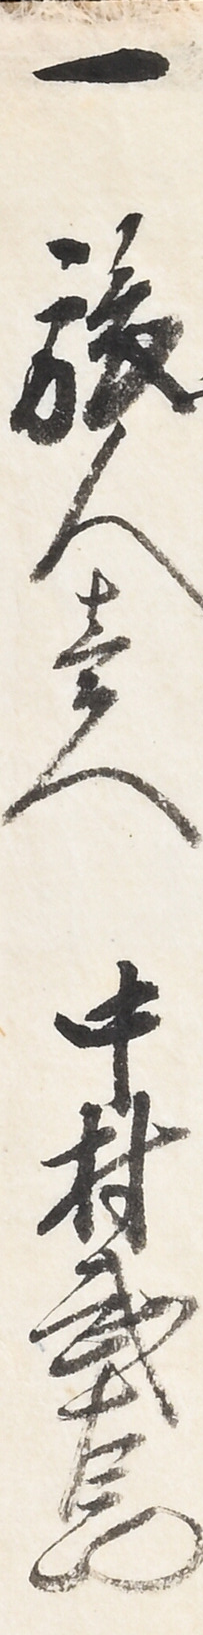一旅人壱人中村武右衛門
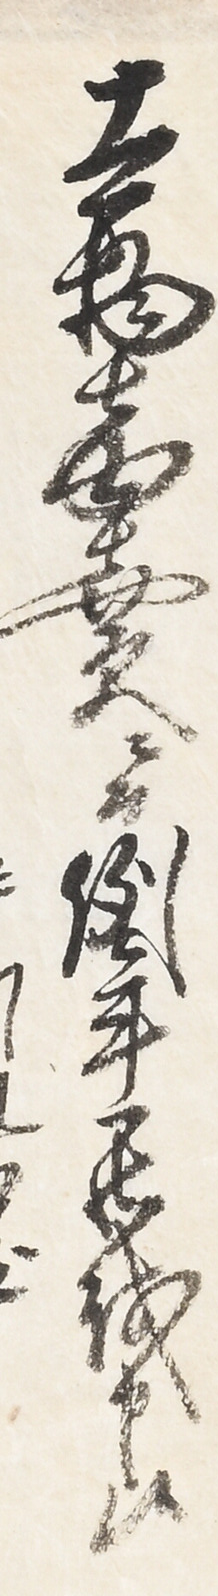太物商売ニ而例年罷越申候
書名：旅人泊控帳
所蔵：伊那市立高遠町図書館・合同会社AMANE
